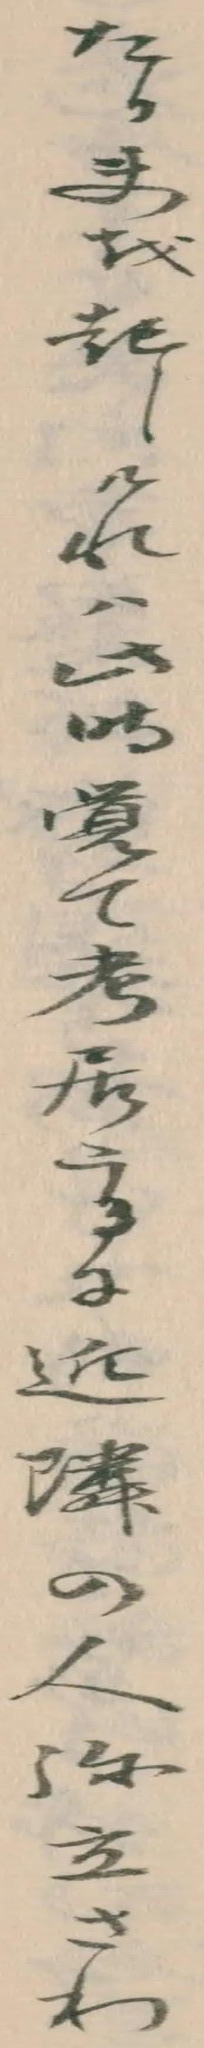たり夫を起しけれは此時覚て考居たるに近隣の人弥立さわ
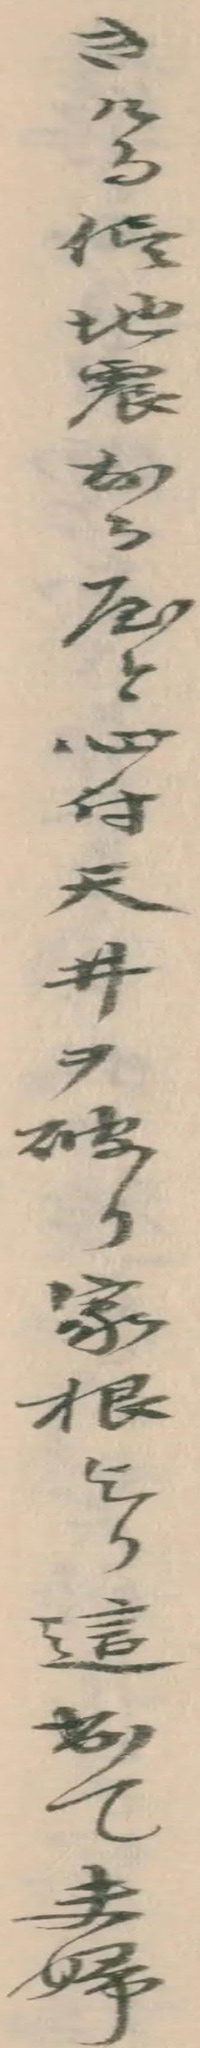きける侭地震なるやと心付天井ヲ破り家根より這出て夫婦
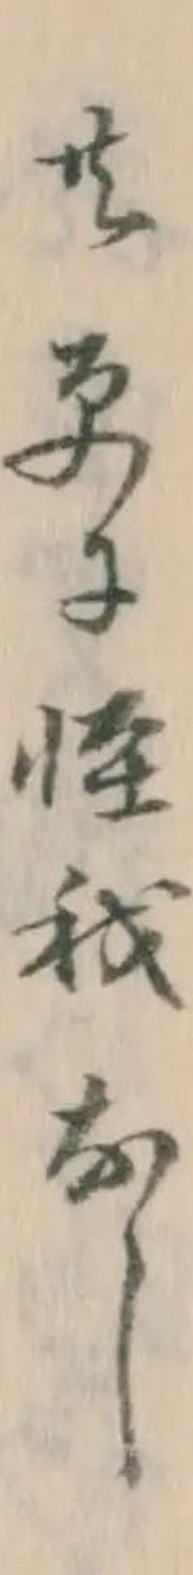共更に怪我なし
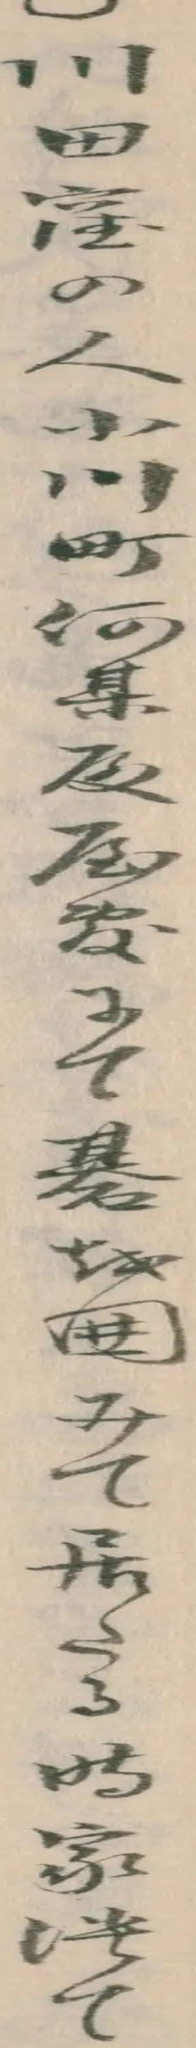〇川田窪の人小川町何某殿屋敷にて碁を囲みて居たる時家潰て
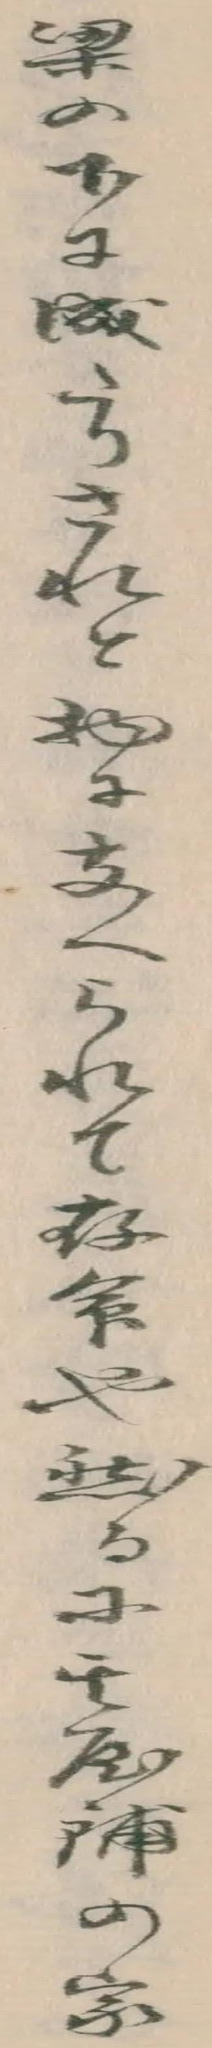梁の下に成たりされと物に支へられて存命や然るに其屋鋪の家
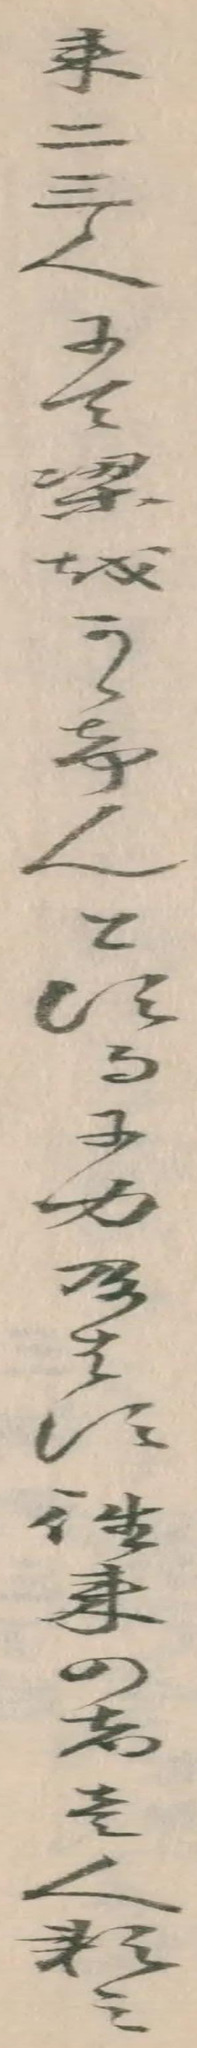来二三人にて梁をかゝけんとするに力及はす往来の者壱人頼み
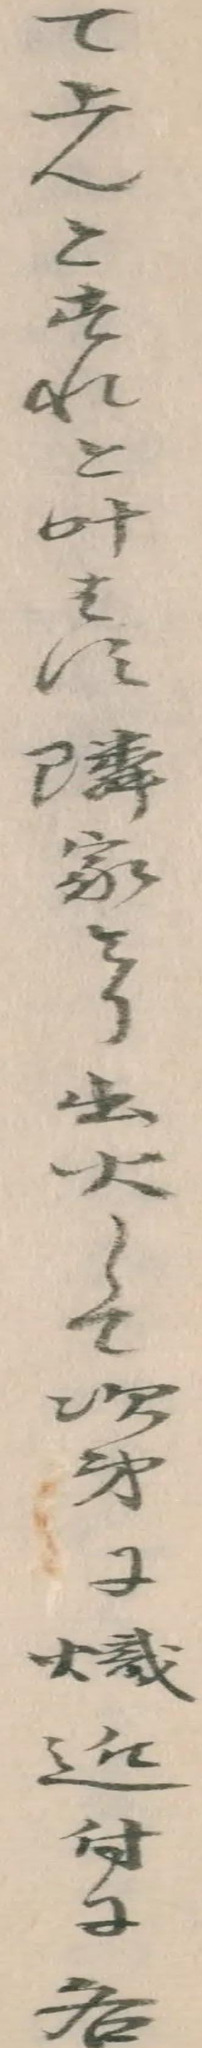て上んとすれと叶はす隣家より出火して次第に̪熾近付に各
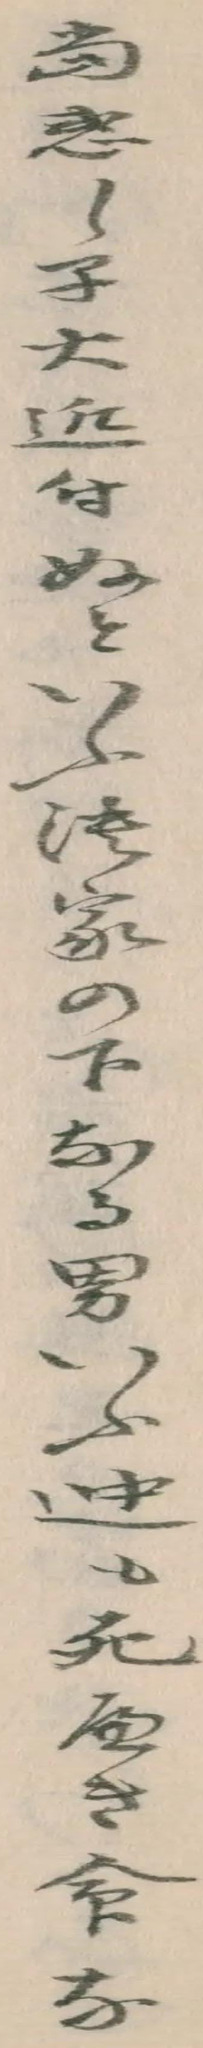当惑し子火近付ぬといふ潰家の下なる男いふ迚も死へき命な
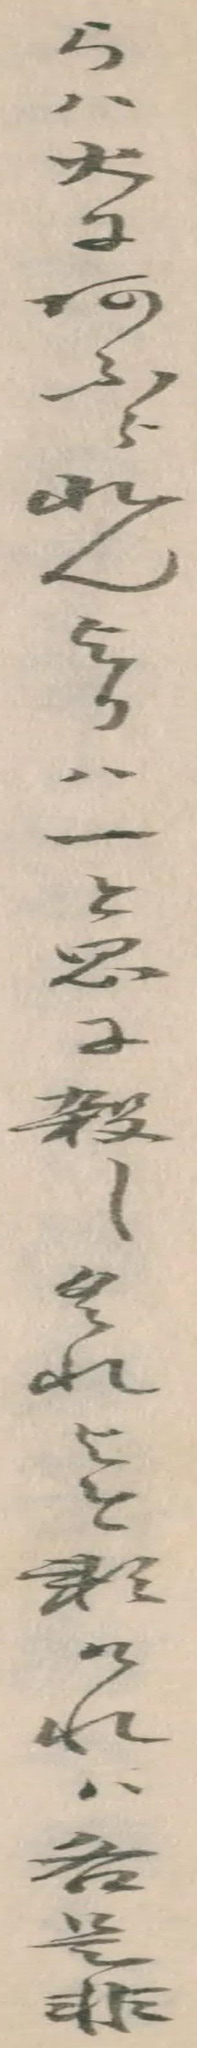らは火にあふられんよりは一と思に殺しくれよと頼けれは各是非
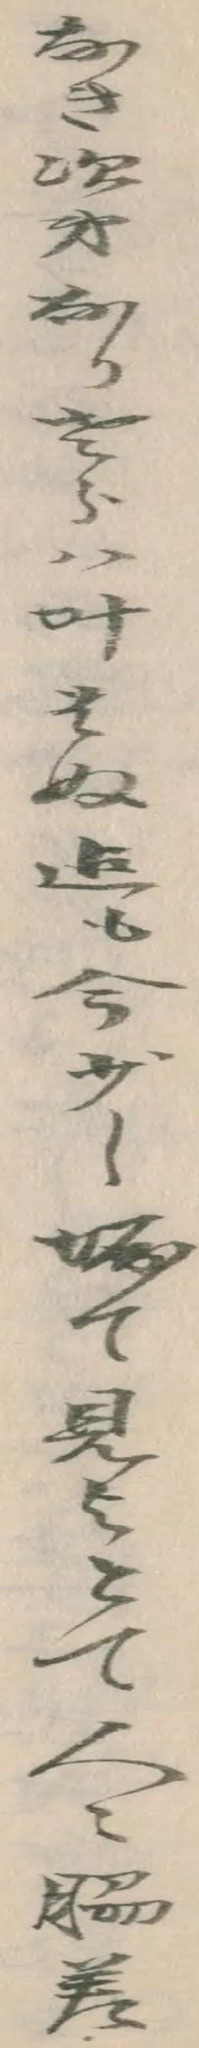なき次第なりさらは叶はぬ迄も今少し掘て見よとて人々脇差
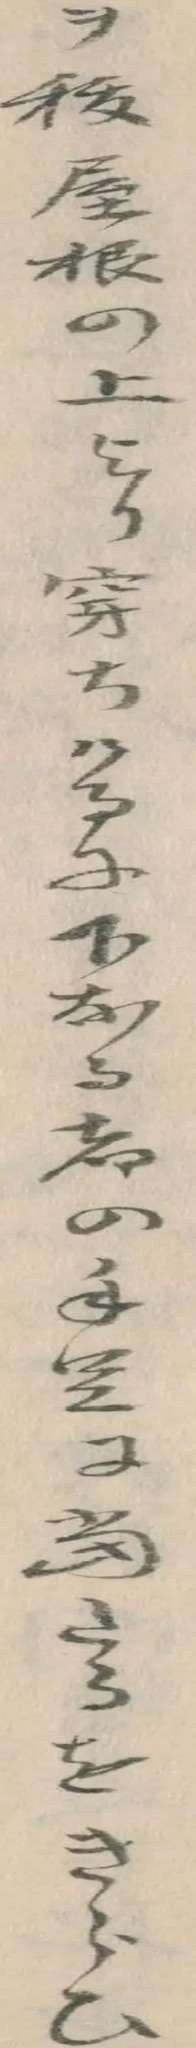ヲ秡屋根の上より穿ちけるに下なる者の手足に当たるをきらひ
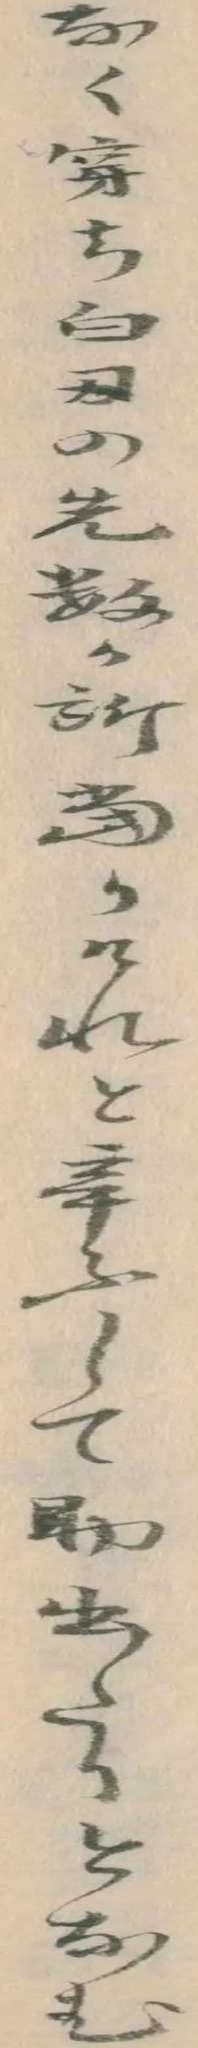なく穿ち白刃の先数ヶ所当りけれと辛ふして助出たりとなむ

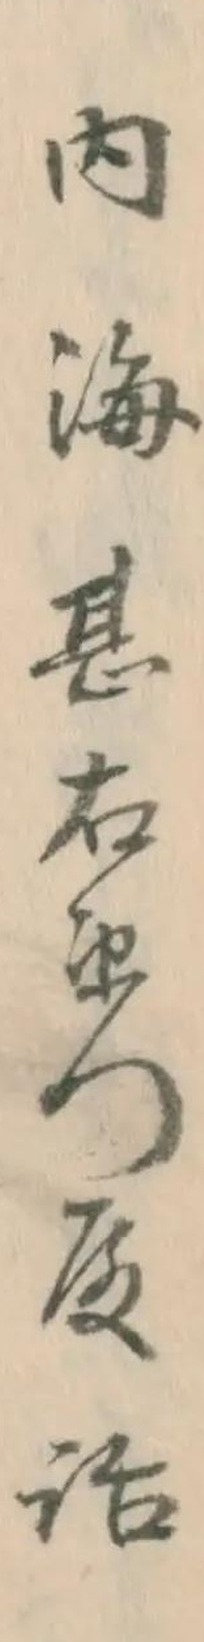内海甚右衛門殿話
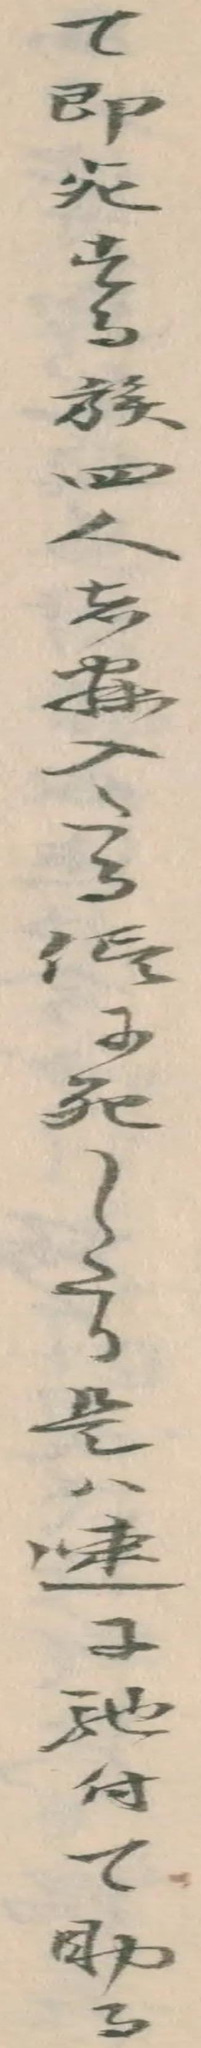て即死する族四人は寐入たる侭に死したり是は速に馳付て助る
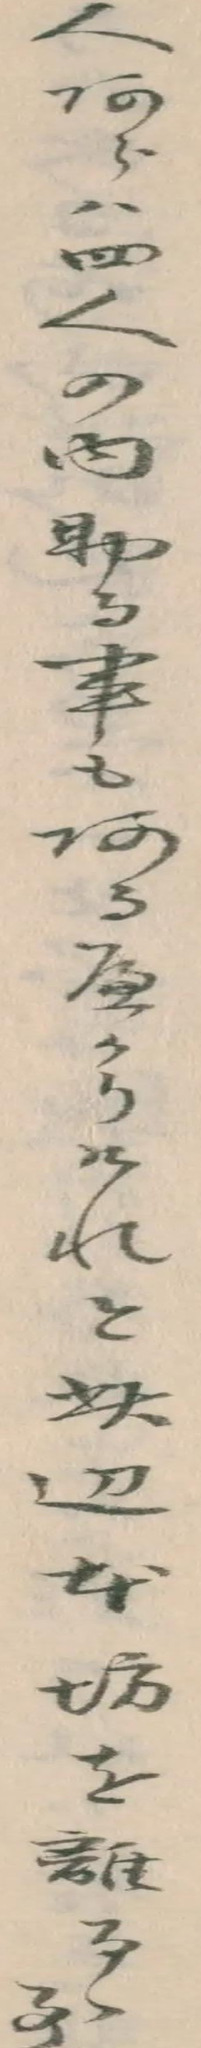人あらは四人の内助る事もあるへかりけれと此辺本坊を離るゝ事
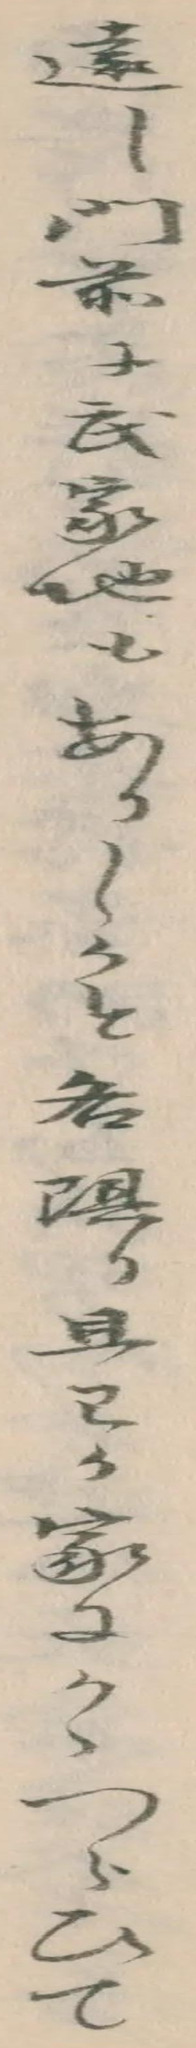遠し門前に武家地もありしかと各惧り且己か家にかゝつらひて
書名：地災撮要. 巻7-9(地震之部)
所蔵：国立国会図書館 National Diet Library, JAPAN
